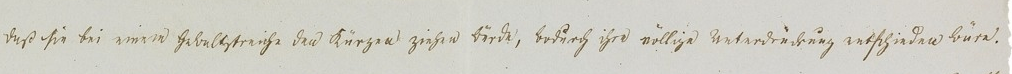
daß sie bei einem Gewaltstreiche den Kürzern ziehen würde, wodurch ihre völlige Unterdrückung entschieden wäre.
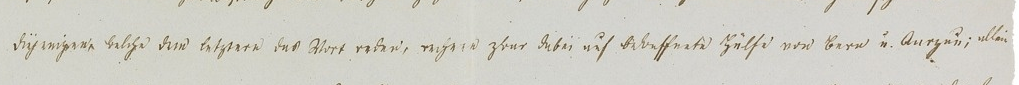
Diejenigen, welche dem letztern das Wort reden, rechnen zwar dabei auf bewaffnete Hülfe von Bern u. Aargau; allein
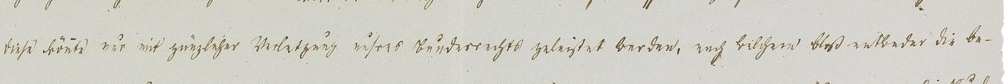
diese könnte nur mit gänzlicher Verletzung unsres Bundesrechts geleistet werden, nach welchem bloß entweder die be-
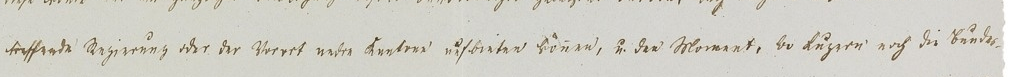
treffende Regierung oder der Vorort andre Kantone aufbieten können, u. den Moment, wo Luzern noch die Bundes-
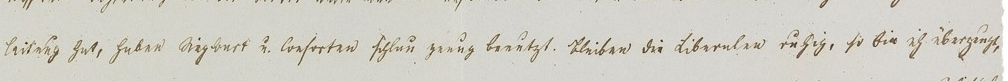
leitung hat, haben Siegwart u. Consorten schlau genug benutzt. Bleiben die Liberalen ruhig, so bin ich überzeugt,
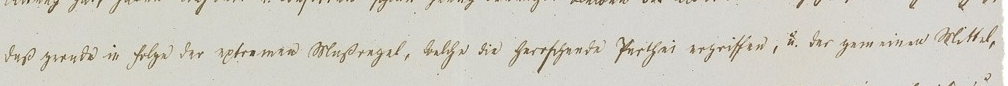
daß gerade in Folge der extremen Maßregel, welche die herrschende Parthei ergriffen, u. der gemeinen Mittel,
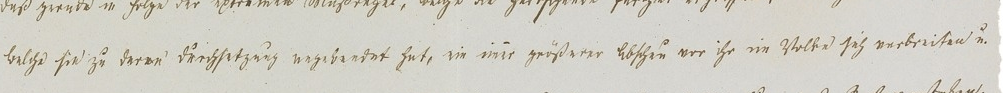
welche sie zu deren Durchsetzung angewendet hat, ein immer größerer Abscheu vor ihr im Volke sich verbreiten u.
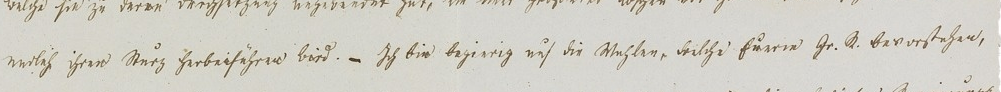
endlich ihren Sturz herbeiführen wird. – Ich bin begierig auf die Wahlen, welche Euerm Gr. R. bevorstehen,
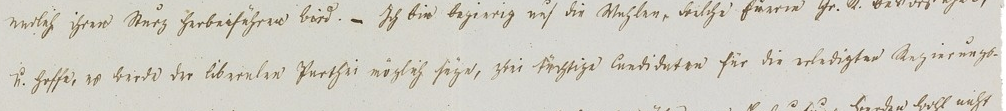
u. hoffe, es werde der liberalen Parthei möglich seyn, zwei tüchtige Candidaten für die erledigten Regierungs-
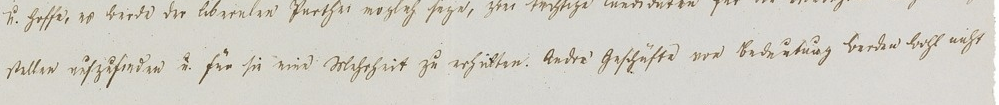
stellen aufzufinden u. für sie eine Mehrheit zu erhalten. Andre Geschäfte von Bedeutung werden wohl nicht
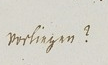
vorliegen?
